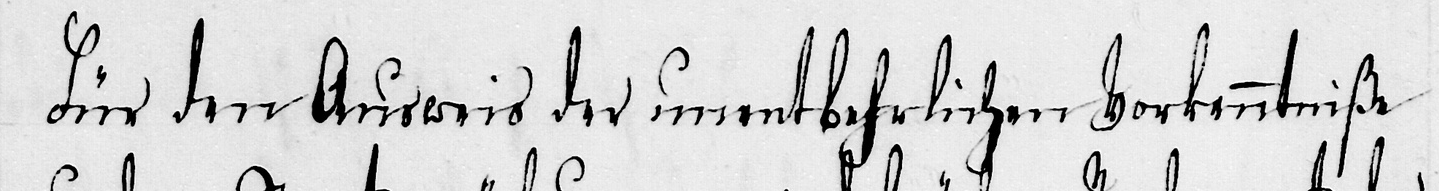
Für den Ausweis der unentbehrlichen Vorkenntniße
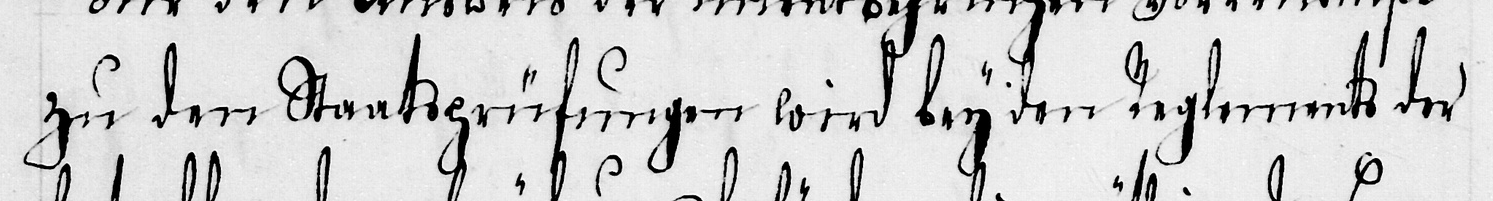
zu den Staatsprüfungen wird bey den Reglements der
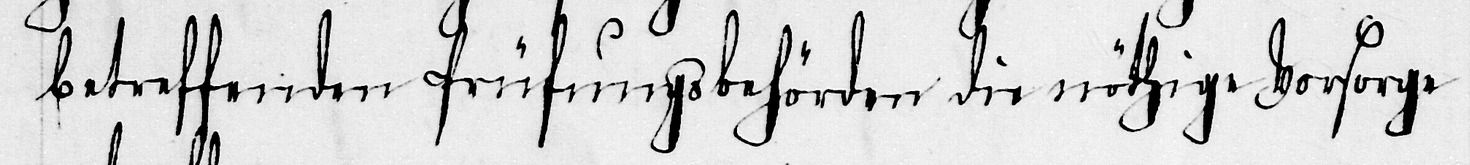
betreffenden Prüfungsbehörden die nöthige Vorsorge
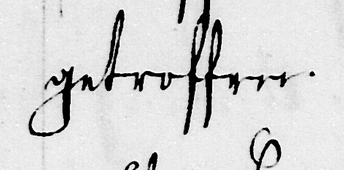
getroffen.
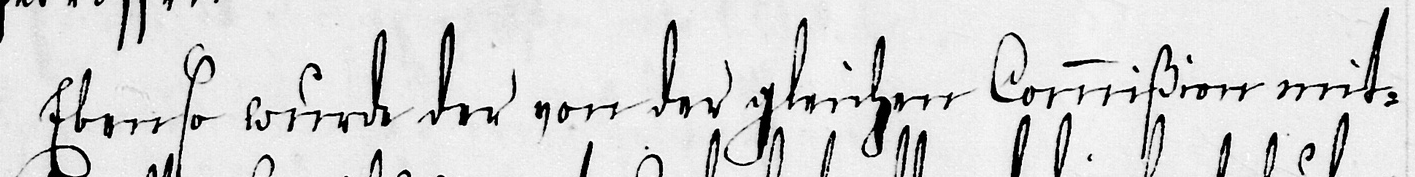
Ebenso wurde der von der gleichen Commißion mit¬
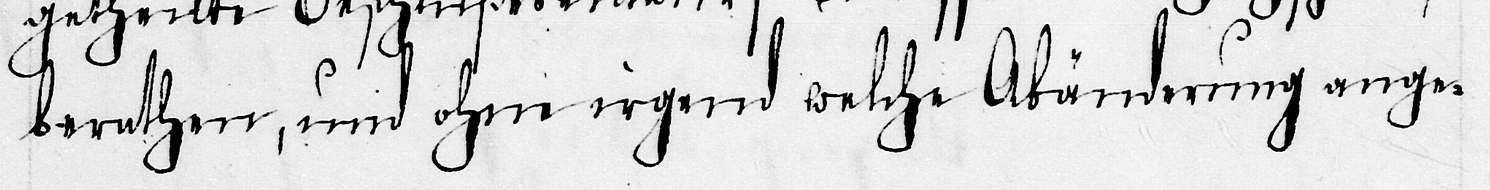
berathen, und ohne irgend welche Abänderung ange¬
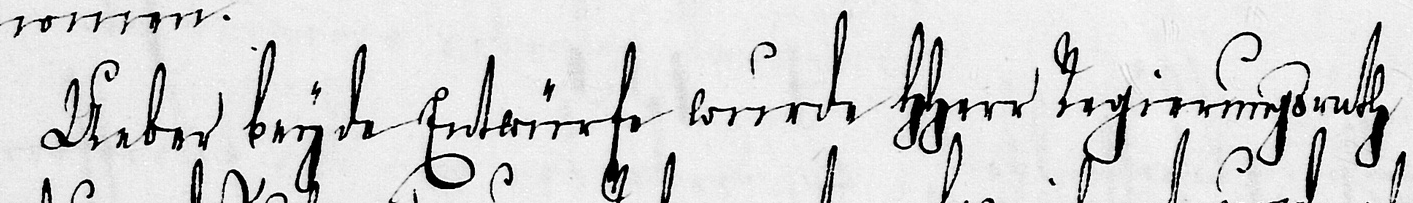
Ueber beyde Entwürfe wurde HHerr Regierungsrath
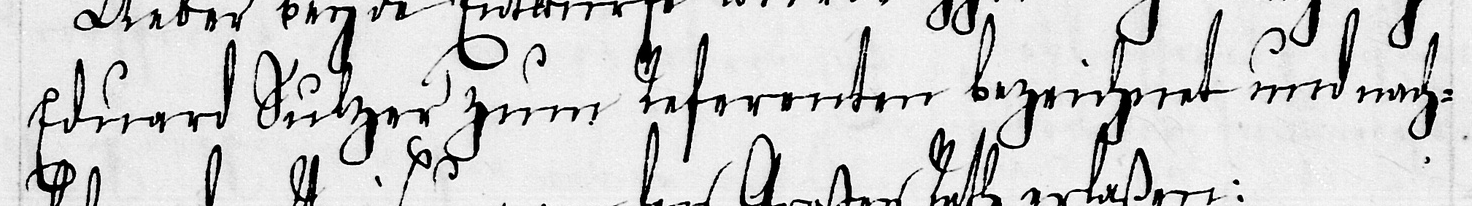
Eduard Sulzer zum Referenten bezeichnet und nach¬
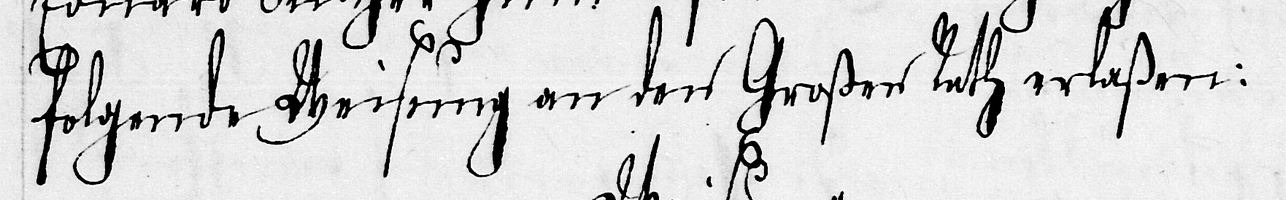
folgende Weisung an den Großen Rath erlaßen:
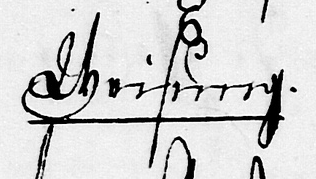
Weisung.
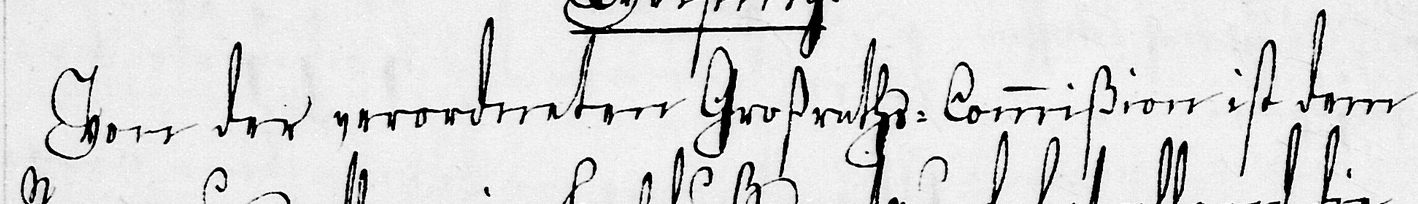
Von der verordneten Großraths-Commißion ist dem
